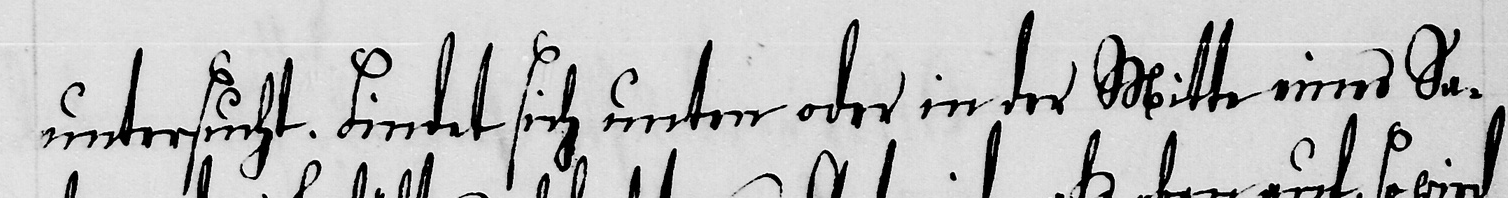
untersucht. Findet sich unter oder in der Mitte eines Sa¬
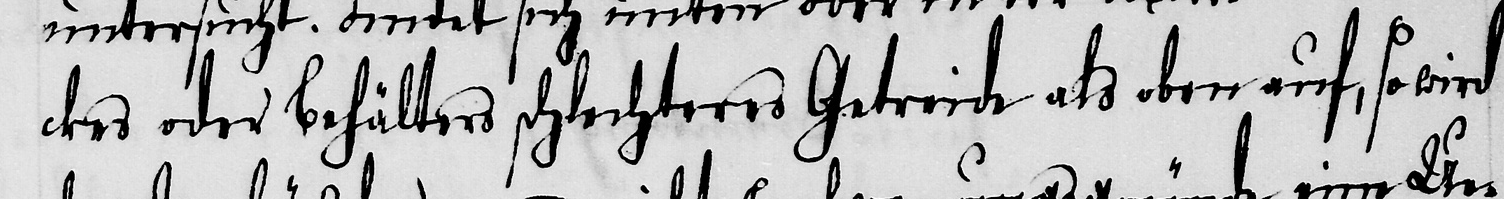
ckes oder Behälters schlechteres Getreide als oben auf, so wird
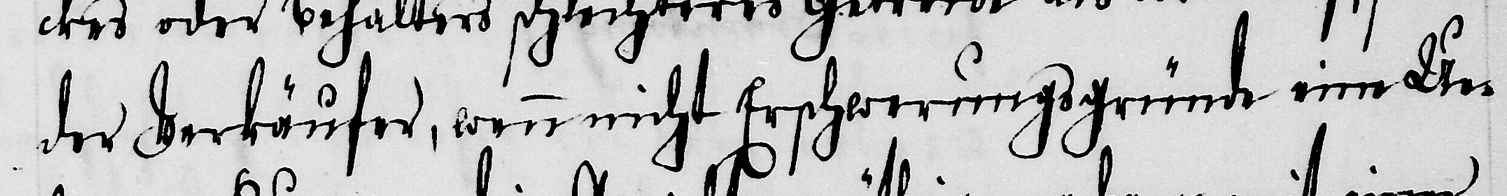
der Verkäufer, wenn nicht Erschwerungsgründe eine Ue¬
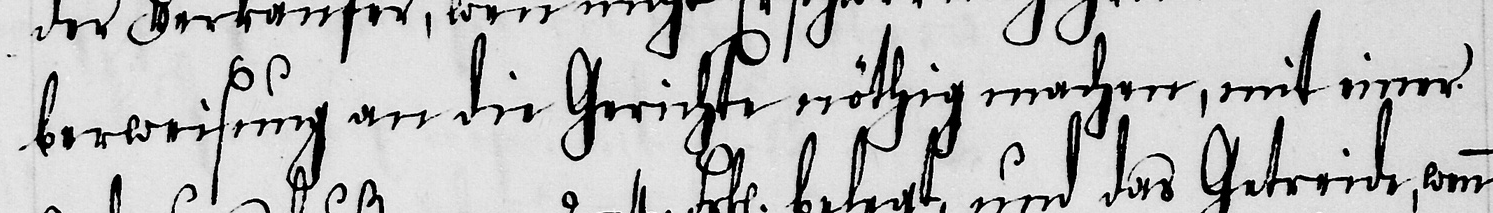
berweisung an die Gerichte nöthig machen, mit einer
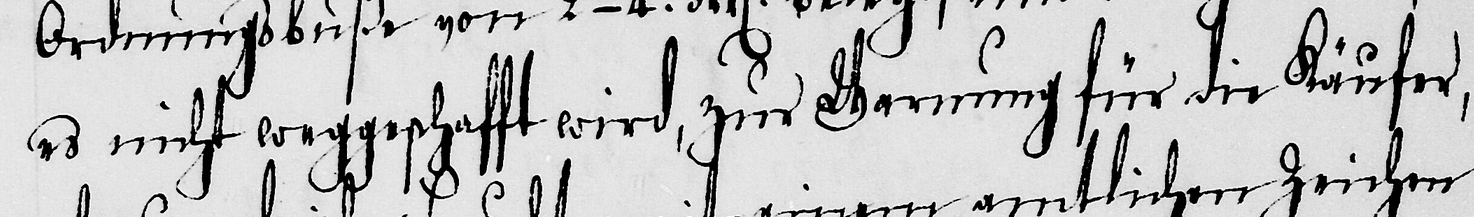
es nicht weggeschafft wird, zur Warnung für die Käufer,
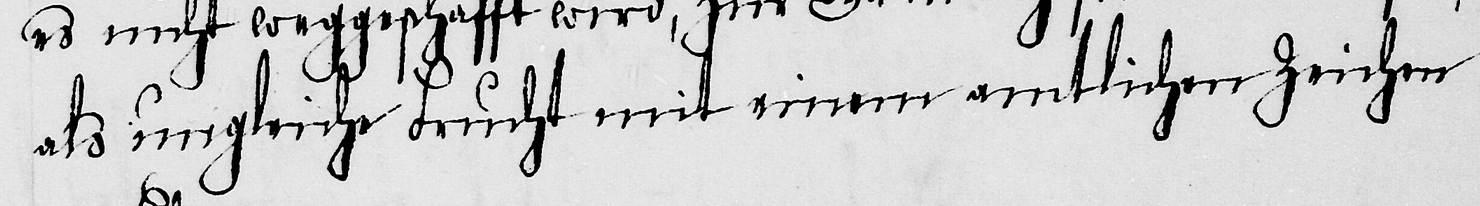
als ungleiche Frucht mit einem amtlichen Zeichen
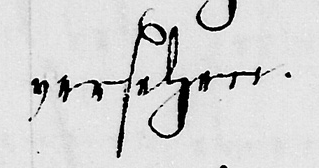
versehen.
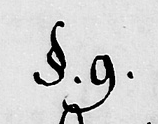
§.9.
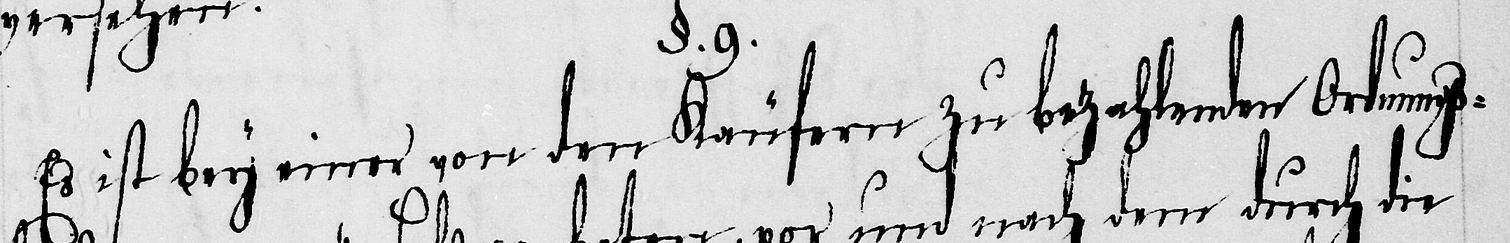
Es ist bey einer von den Käufern zu bezahlenden Ordnungs¬
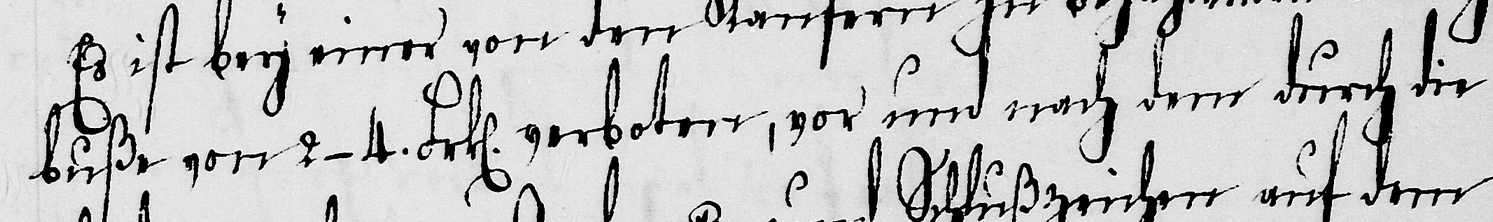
buße von 2–4. Frk[en]. verboten, vor und nach dem durch die
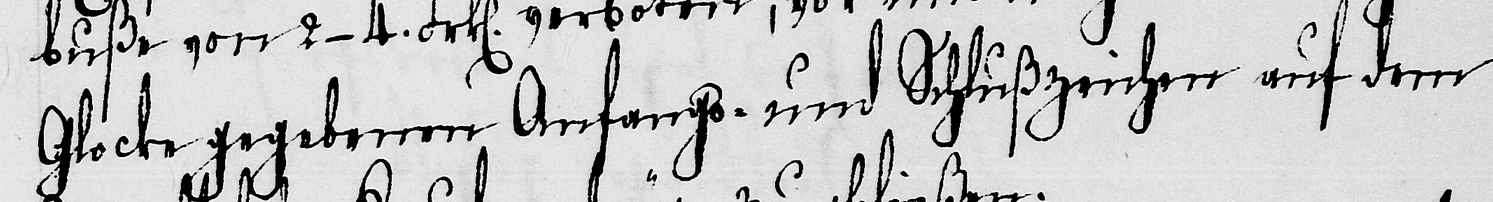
Glocke gegebenen Anfangs- und Schlußzeichen auf dem
